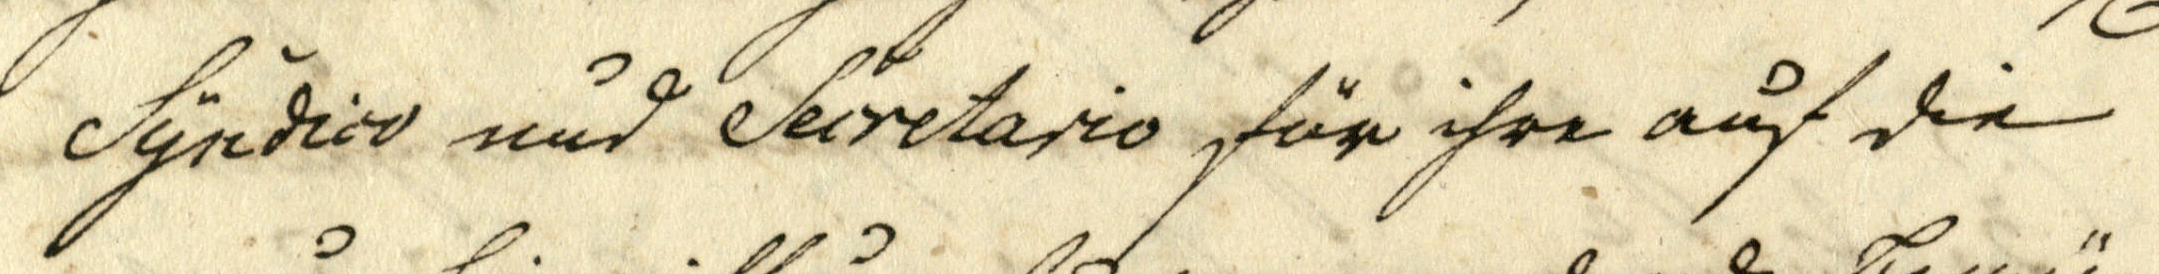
Sÿndico und Secretario für ihre auf die
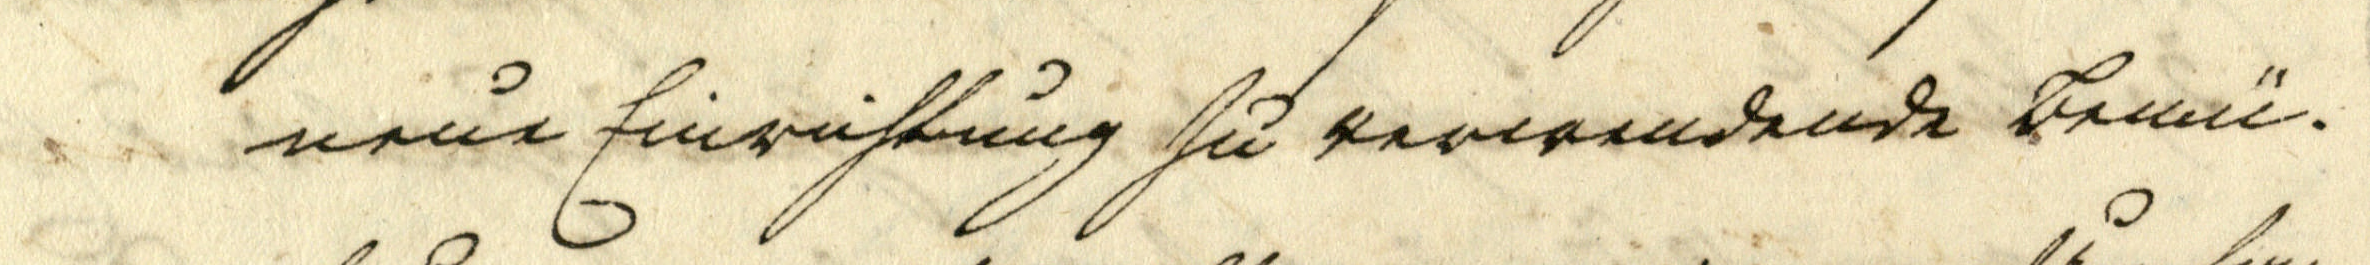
neue Einrichtung zu verwendende Bemü¬
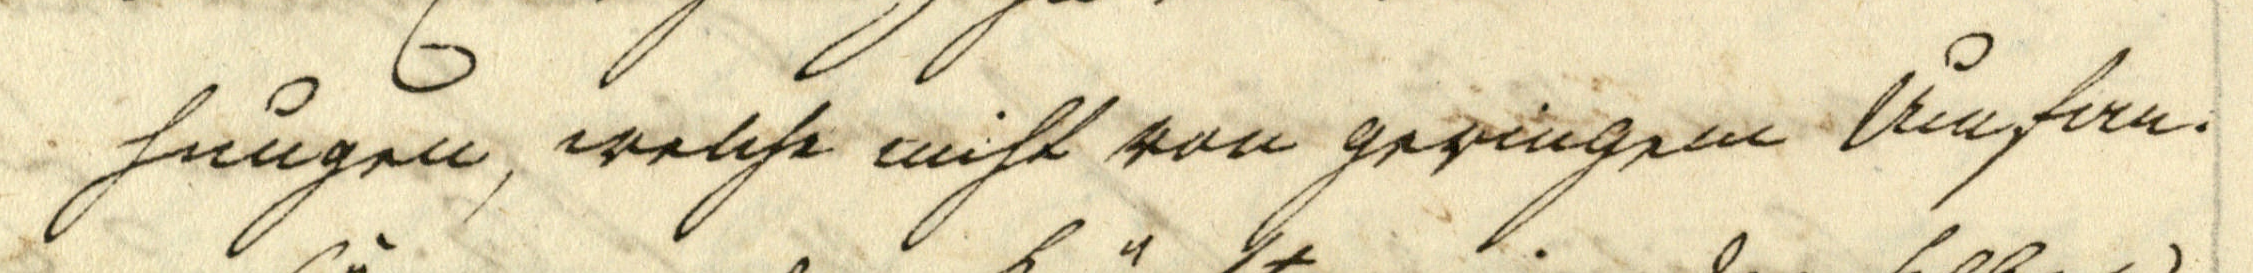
hungen, welche nicht von geringem Umfan¬
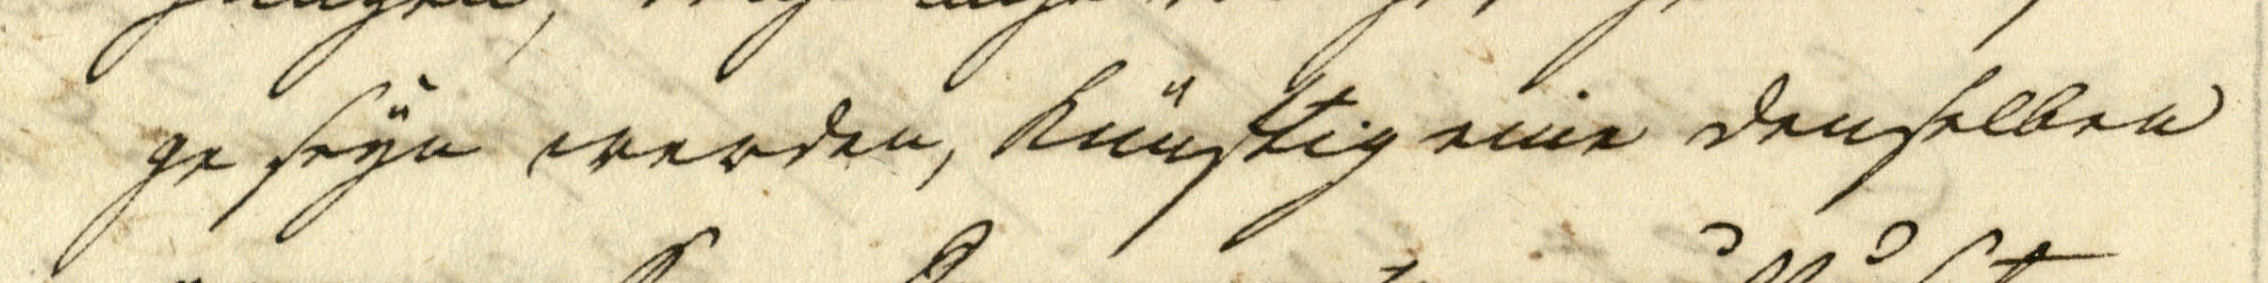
ge seÿn werden, künftig eine denselben
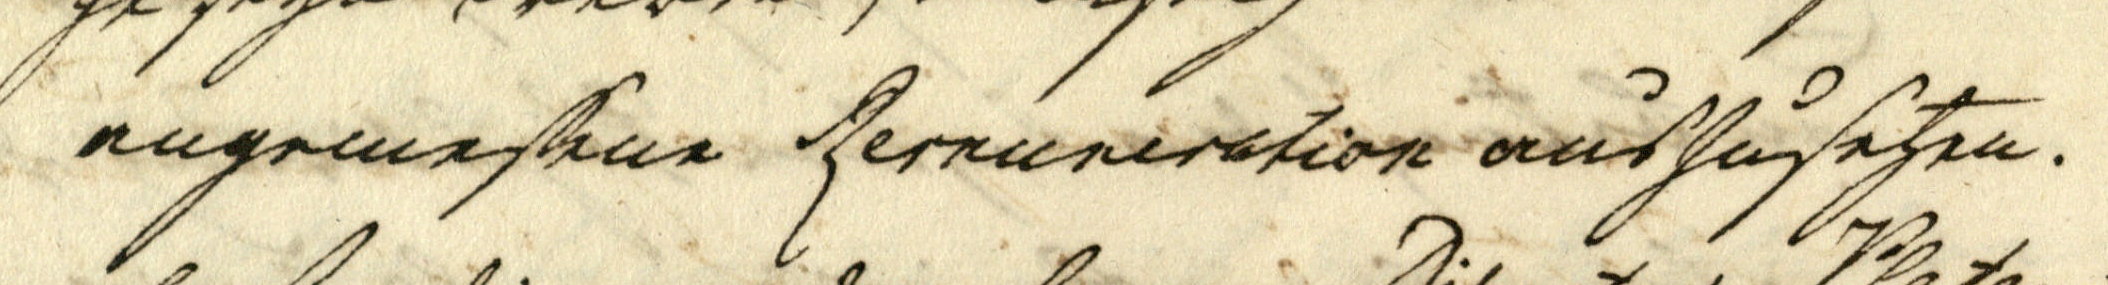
angemessene Remuneration auszusetzen.
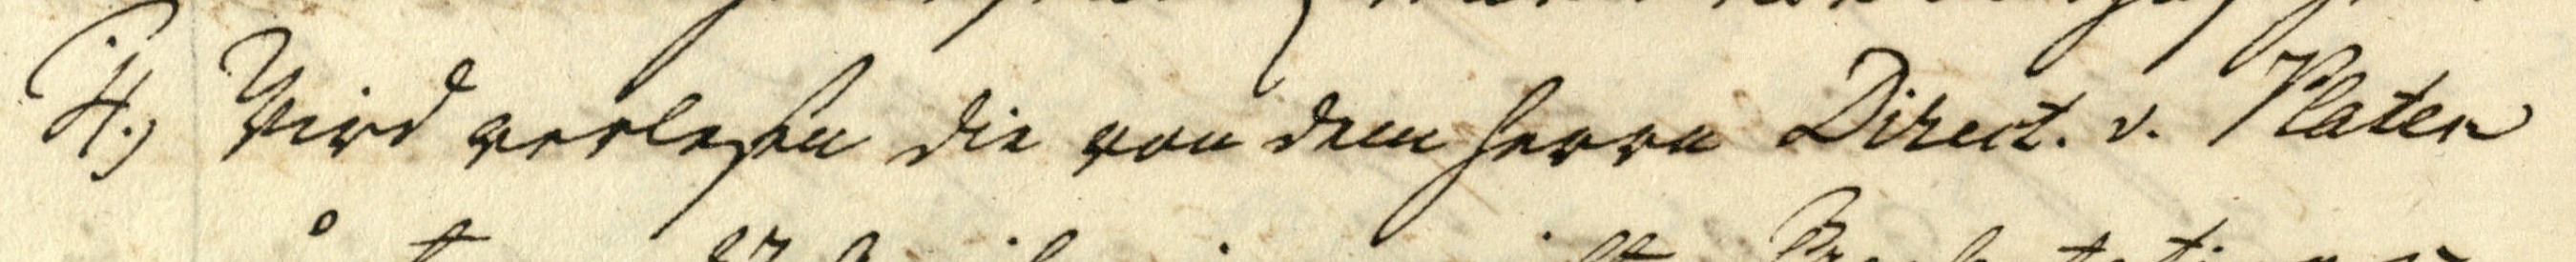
4. Wird verlesen die von dem Herrn Direct. v. Platen
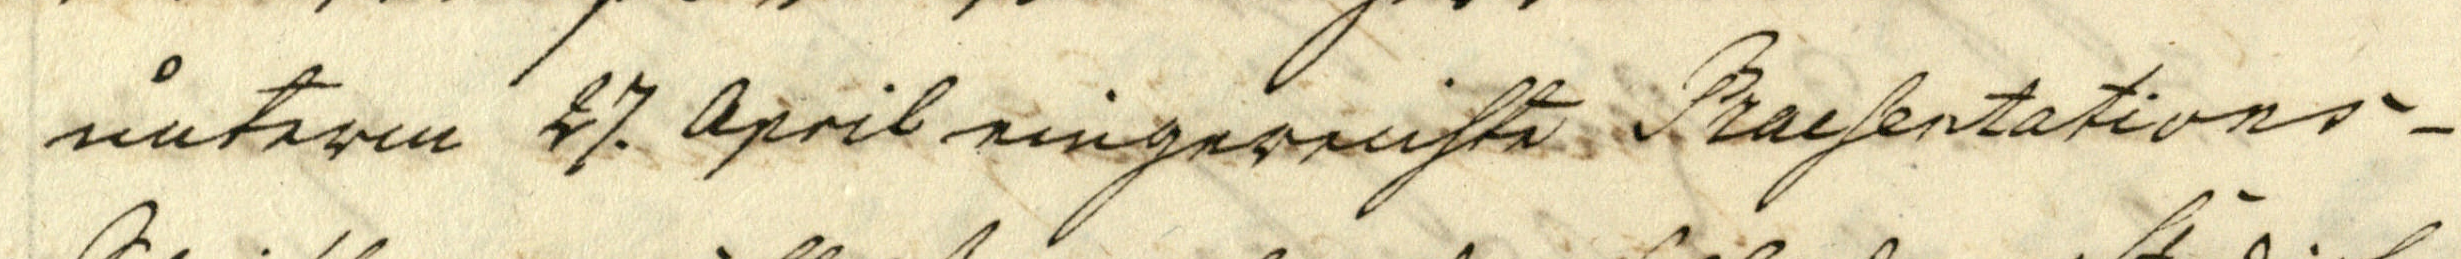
unterm 27. April eingereichte Praesentations-
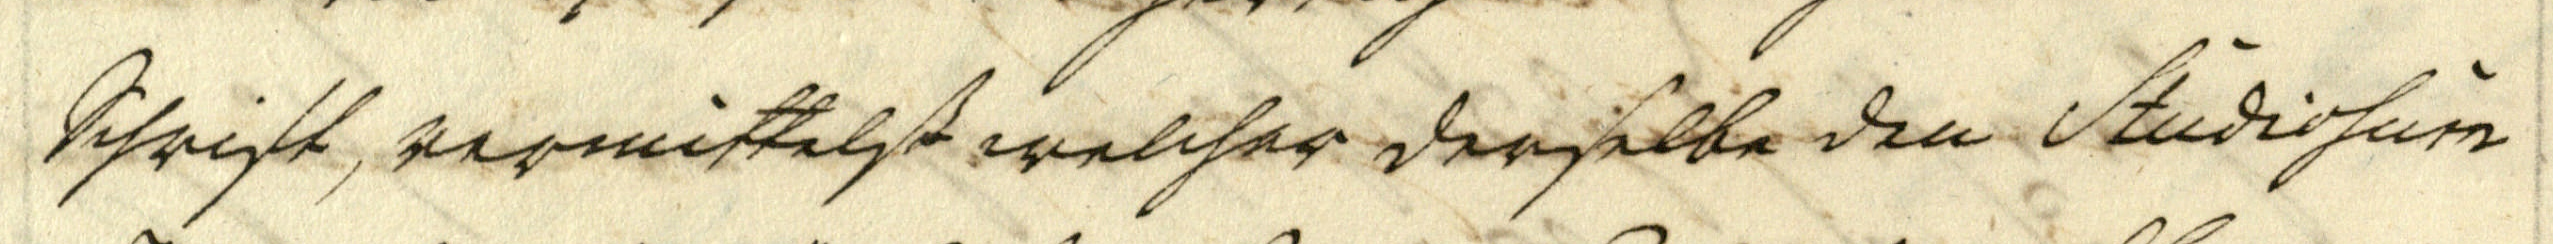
Schrift vermittelst welcher derselbe den Studiosum
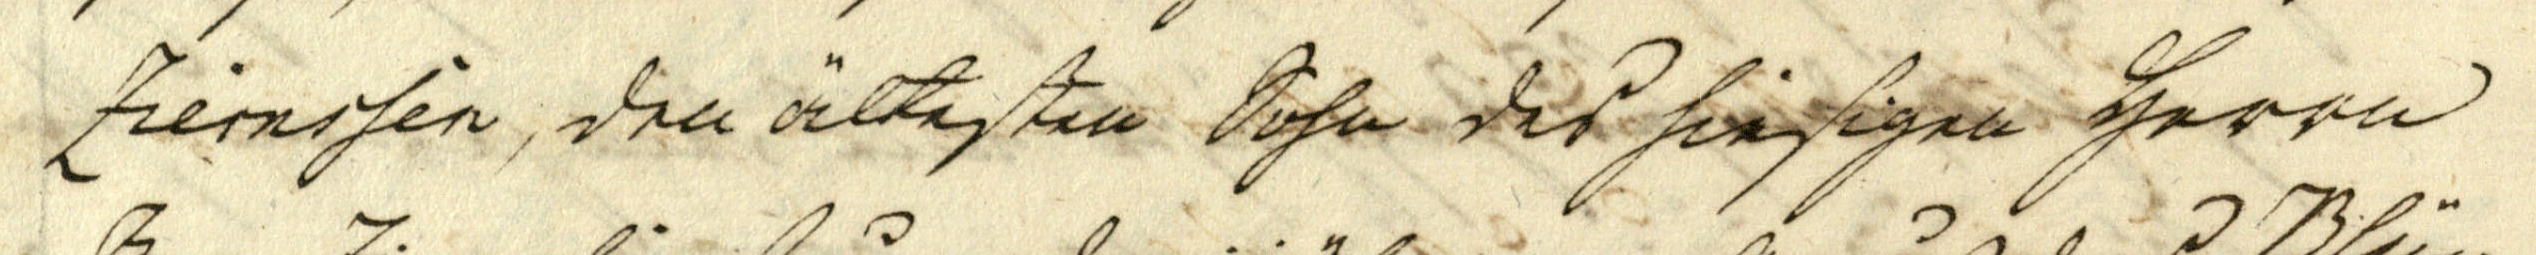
Ziemssen, den ältesten Sohn des hiesigen Herrn
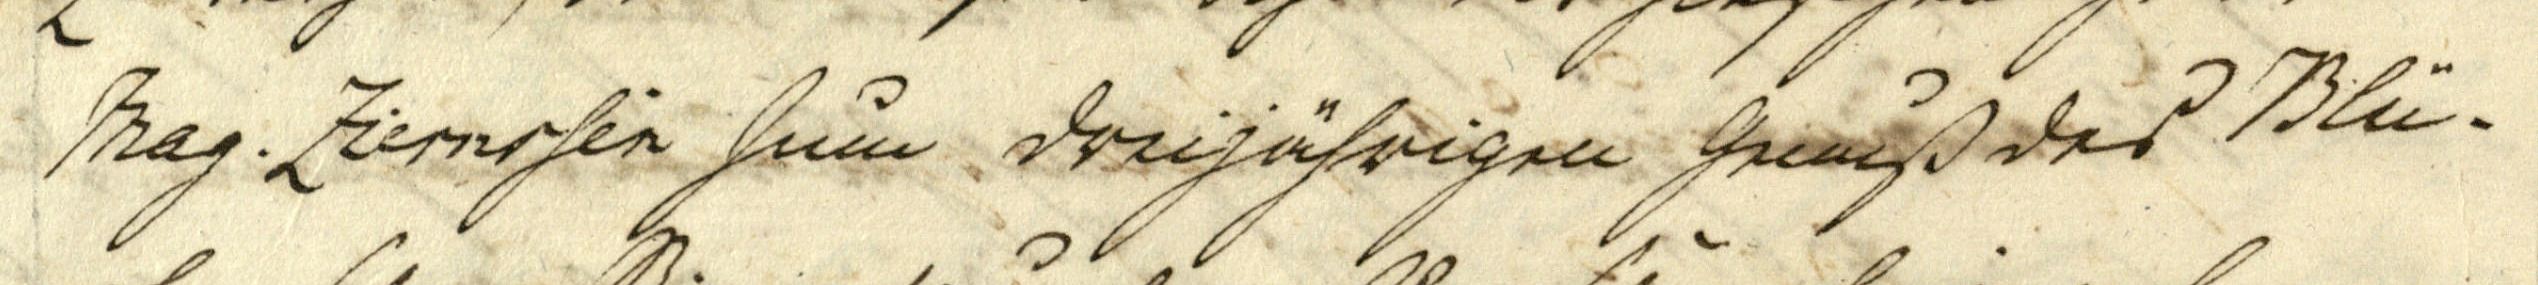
Mag. Ziemssen zum dreijährigen Genuß des Blü¬
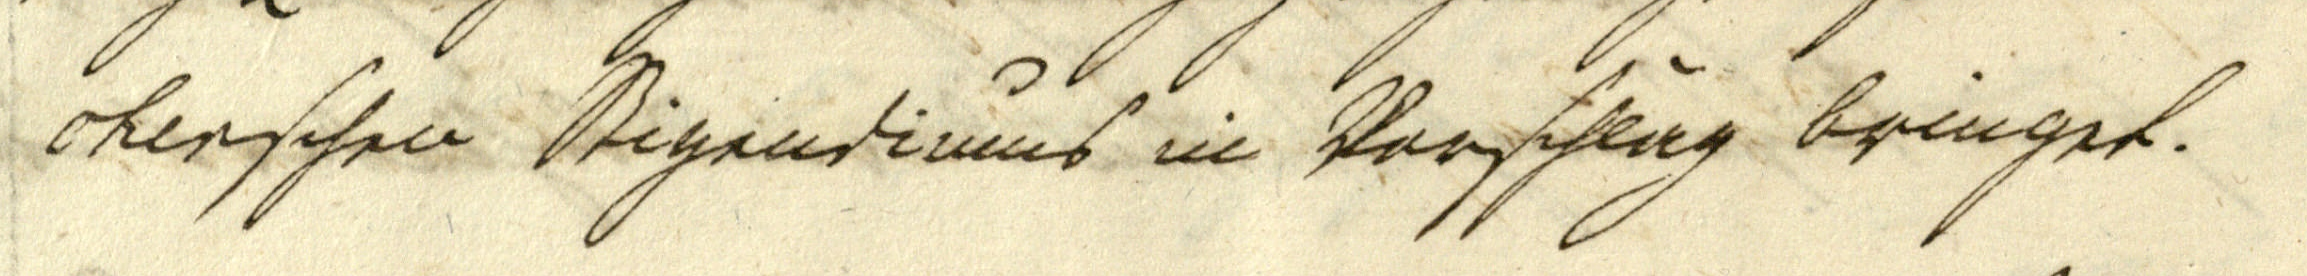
cherschen Stipendiums in Vorschlag bringet.
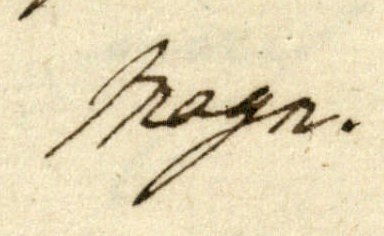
Magn.
